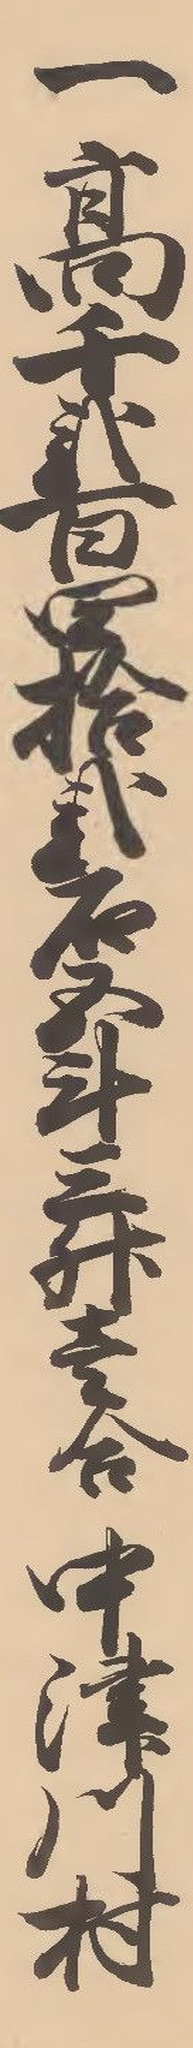一高千弐百四拾弐石五斗三升壱合中津川村
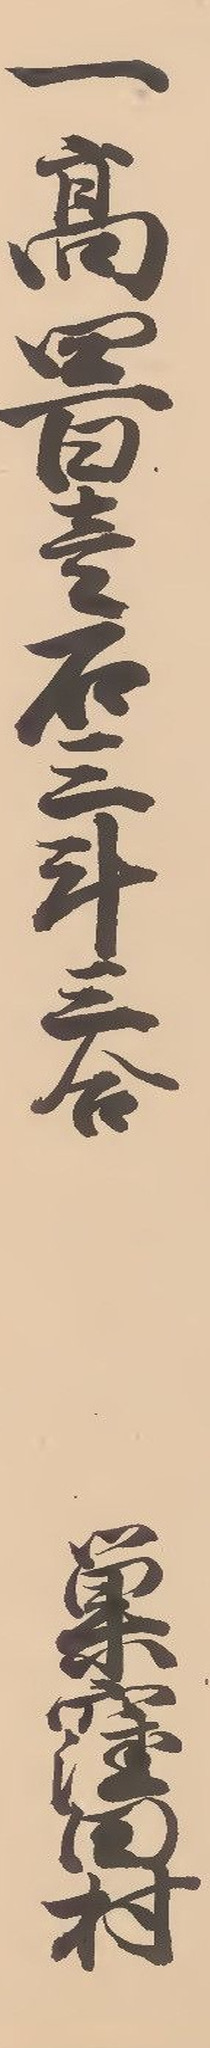一高四百壱石三斗三合巣窪田村
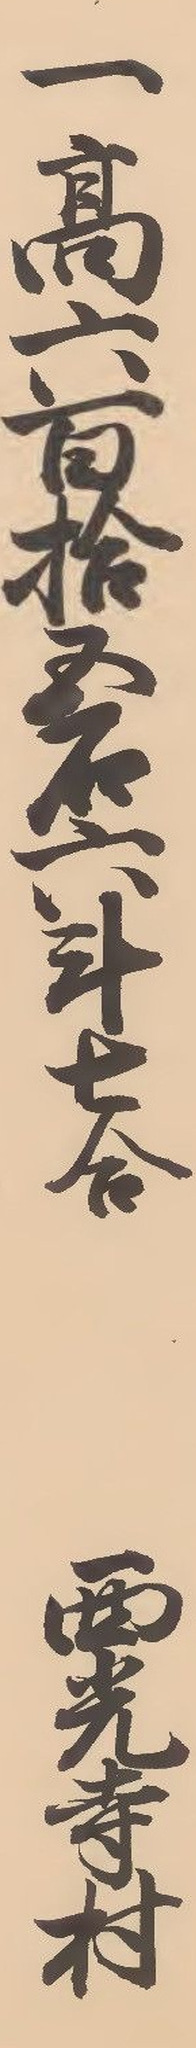一高六百拾五石六斗七合西光寺村
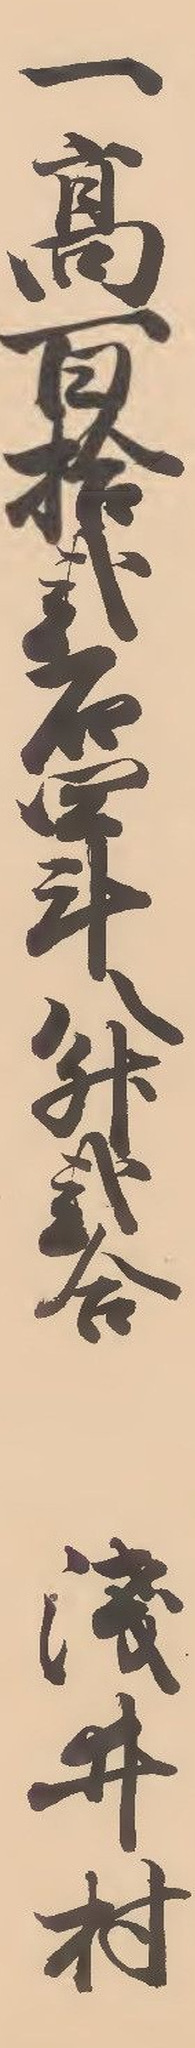一高百拾弐石四斗八升弐合浅井村
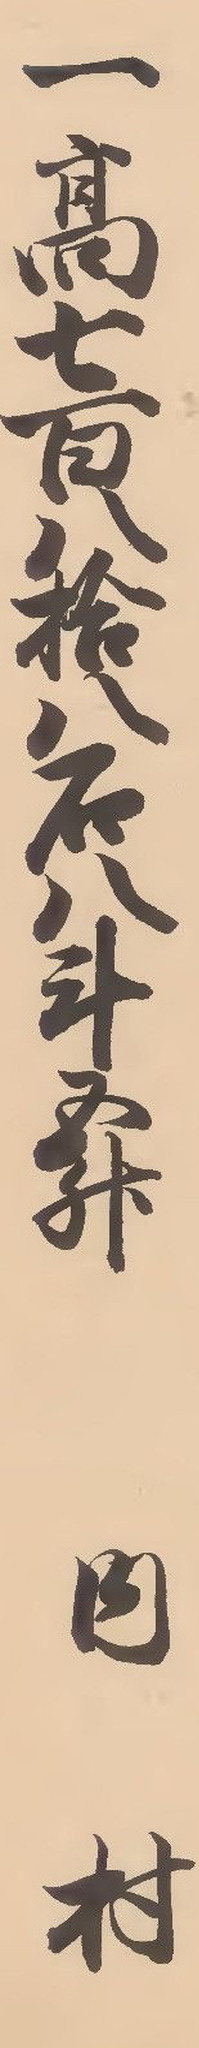一高七百八拾八石八斗五升内村

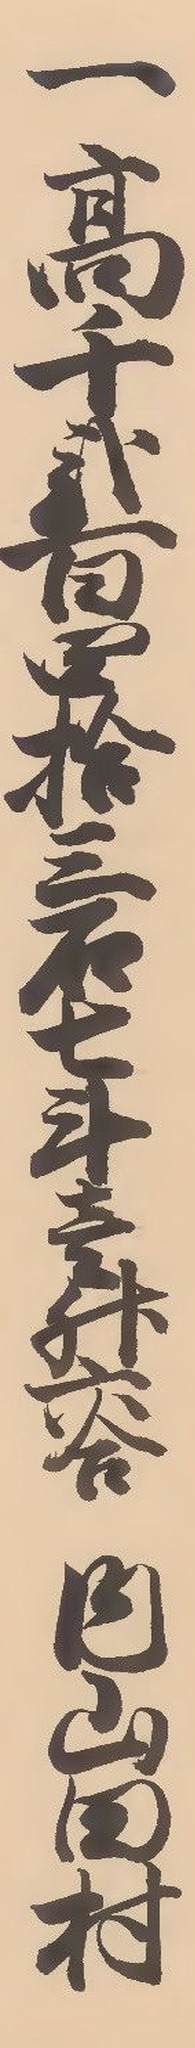一高千弐百四拾三石七斗壱升六合内山田村
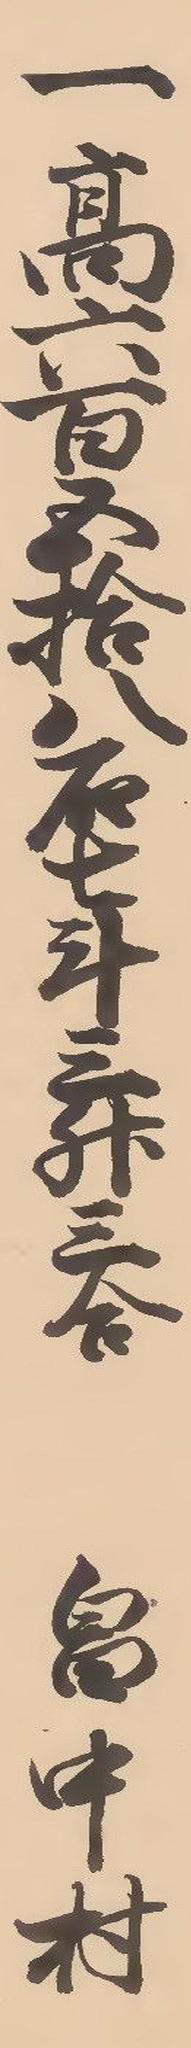一高六百五拾八石七斗三升三合畠中村
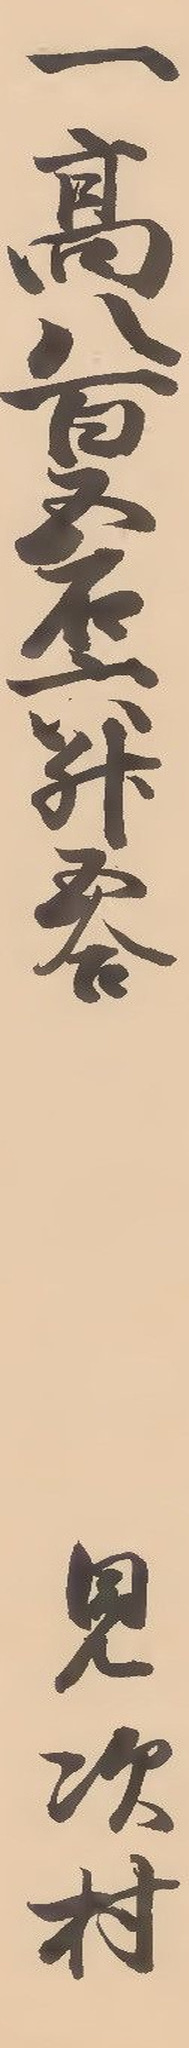一高八百五石六升五合見次村
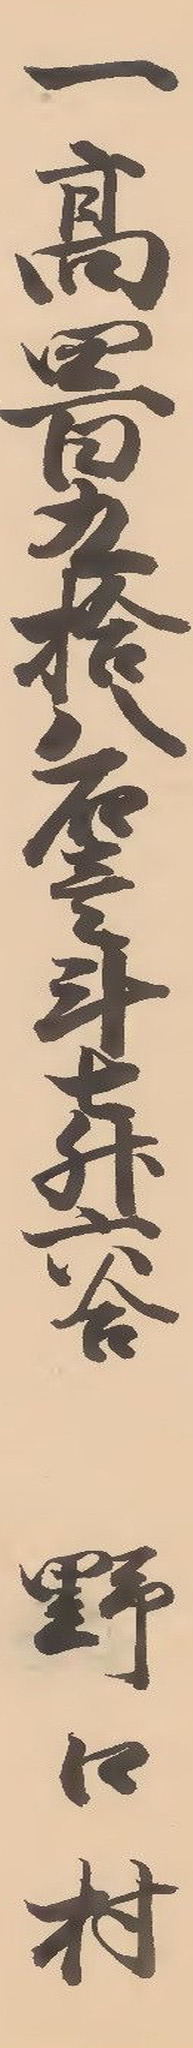一高四百九拾八石壱斗七升六合野口村
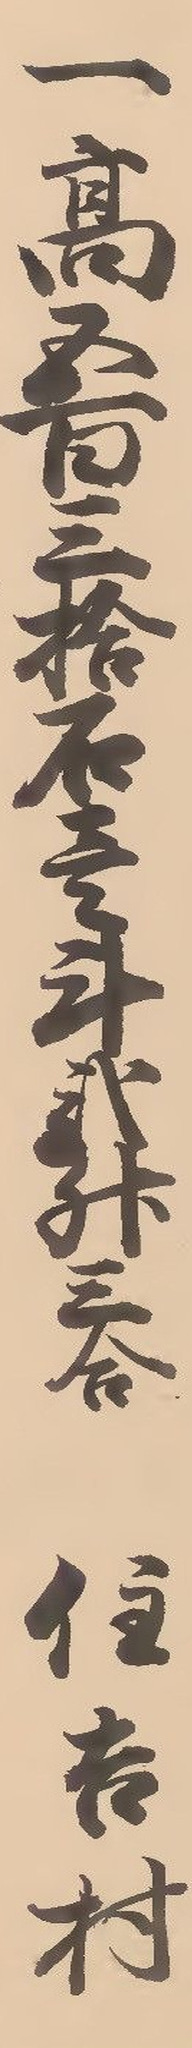一高五百三拾石壱斗弐升三合住吉村
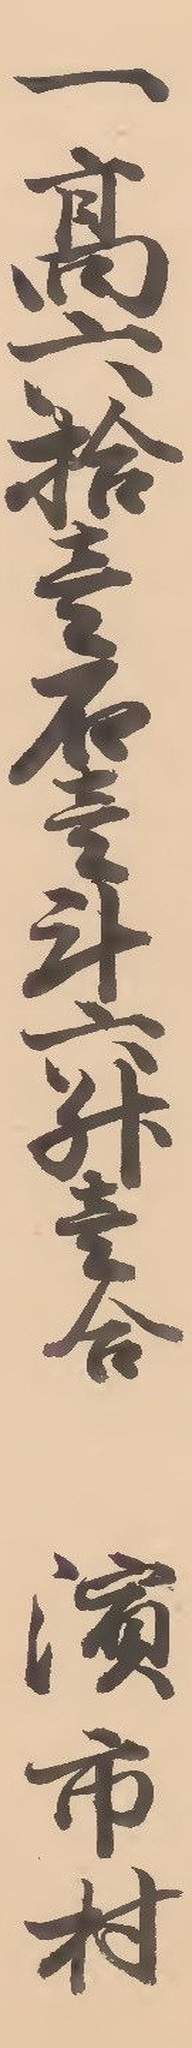一高六拾壱石壱斗六升壱合浜市村
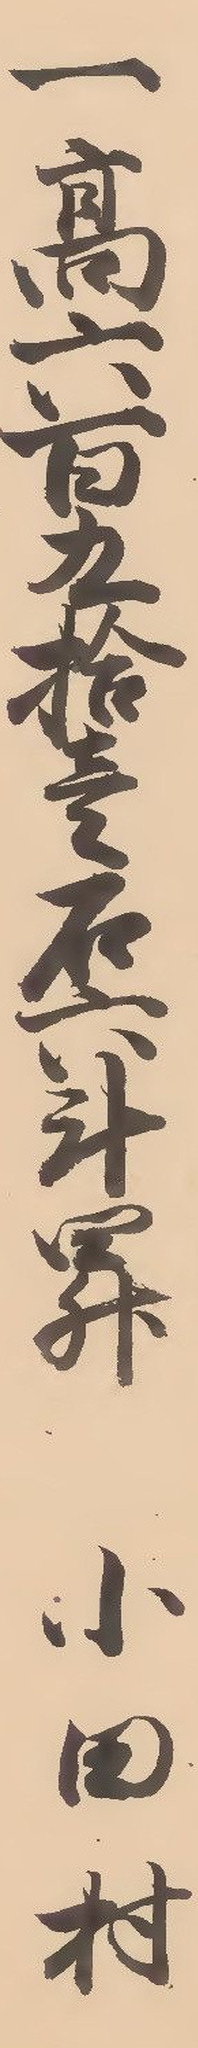一高六百九拾壱石六斗四升小田村
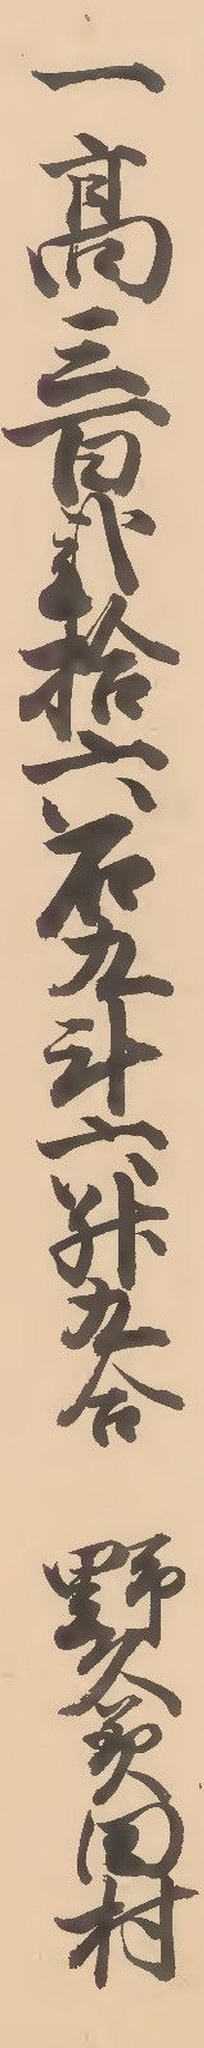一高三百弐拾六石九斗六升九合野久美田村

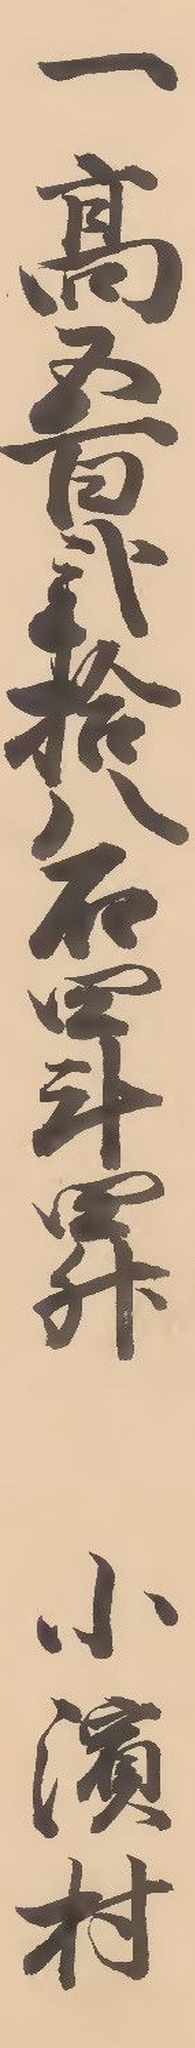一高五百弐拾八石四斗四升小浜村
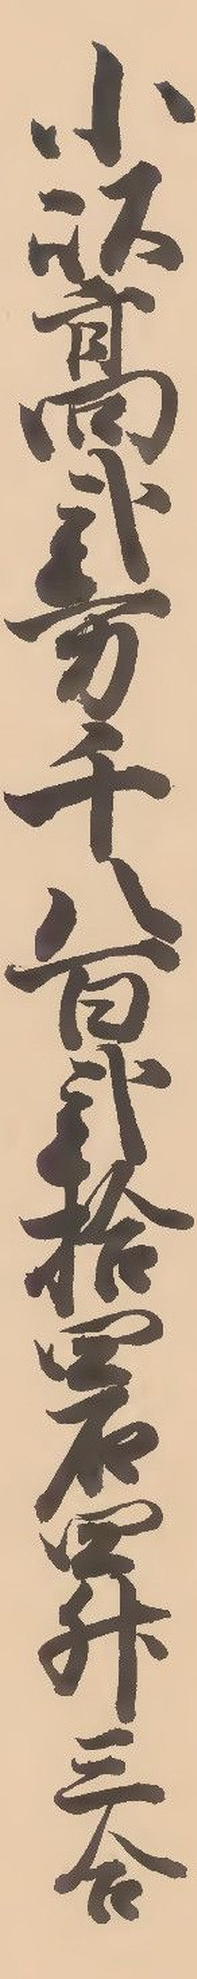小以高弐万千八百弐拾四石四升三合
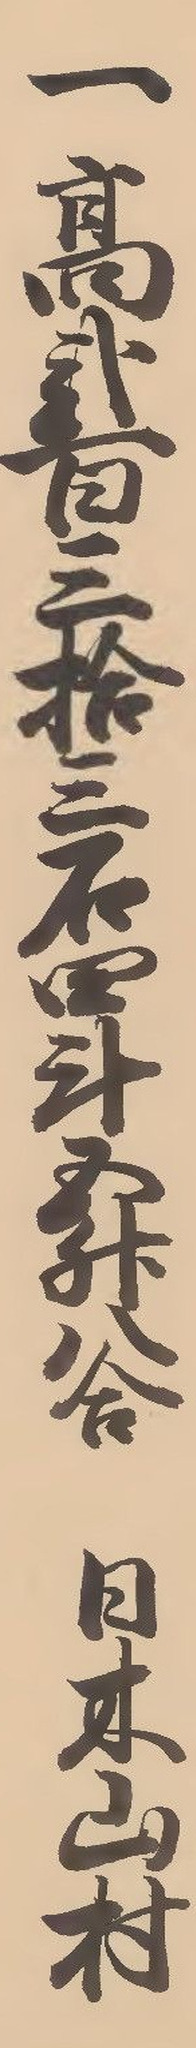一高弐百三拾三石四斗五升八合日木山村
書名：大隅国郷帳
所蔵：国立公文書館 National Archives of Japan
